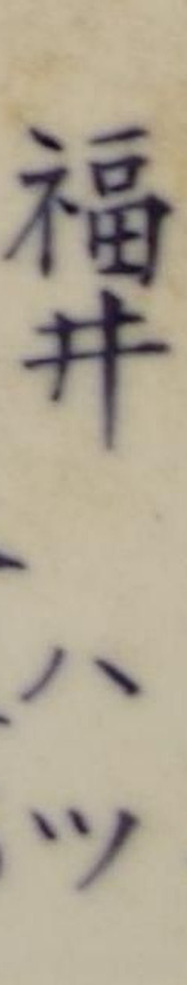福井ハツ
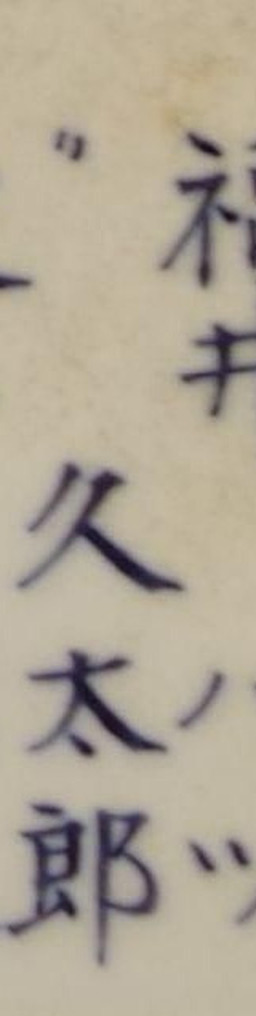久太郎
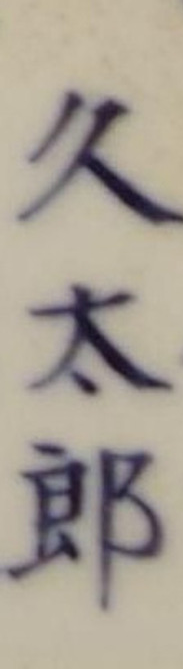久太郎
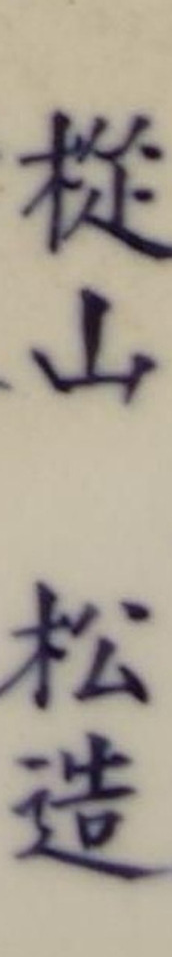樅山松造
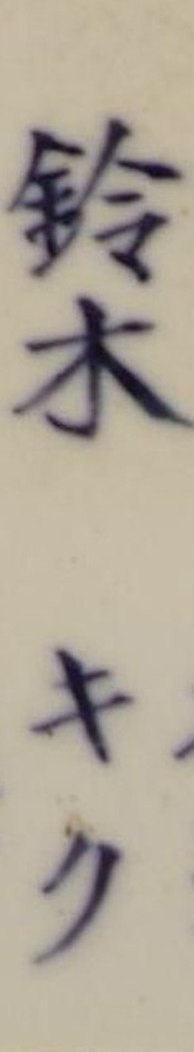鈴木キク
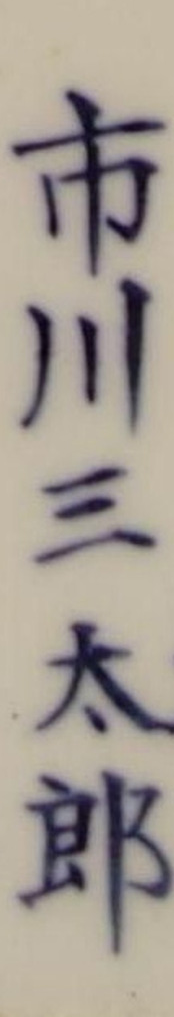市川三太郎
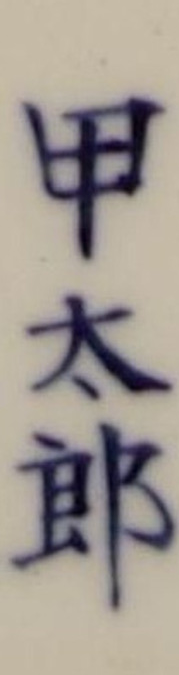甲太郎
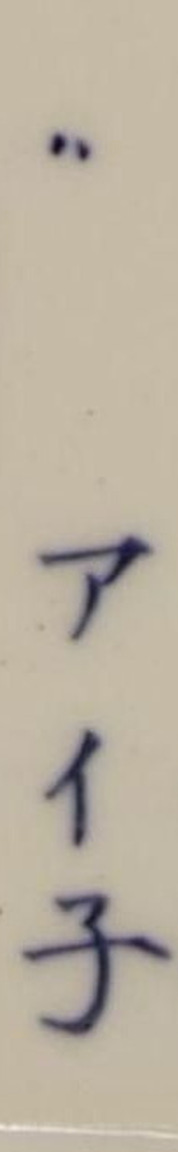アイ子
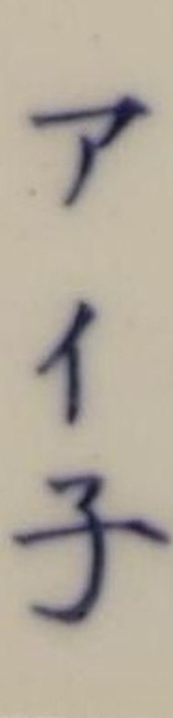アイ子
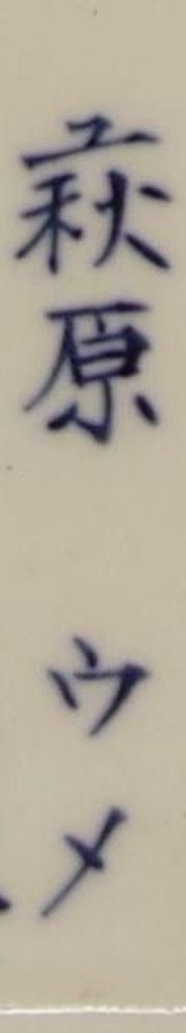萩原ウメ
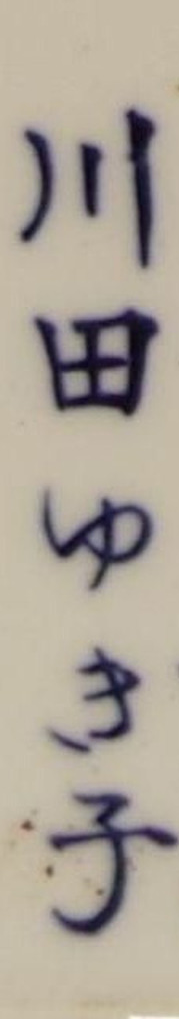川田ゆき子
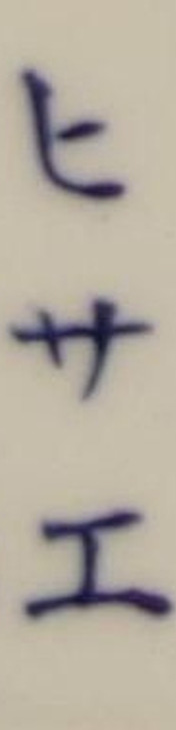ヒサエ

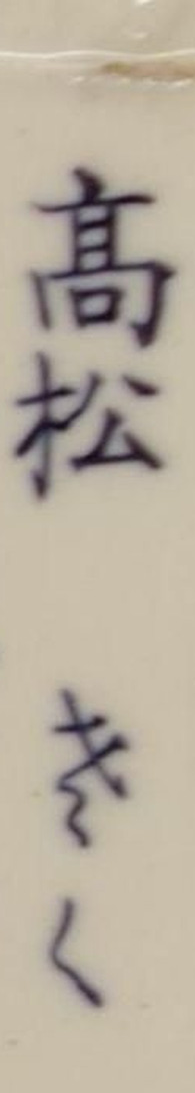高松きく
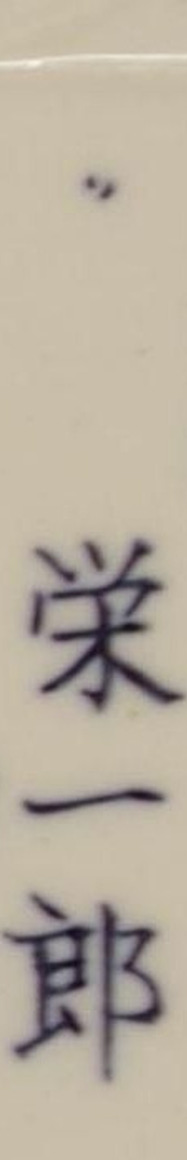栄一郎
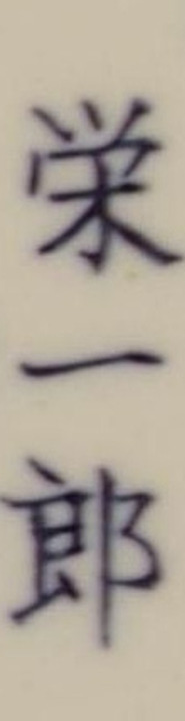栄一郎
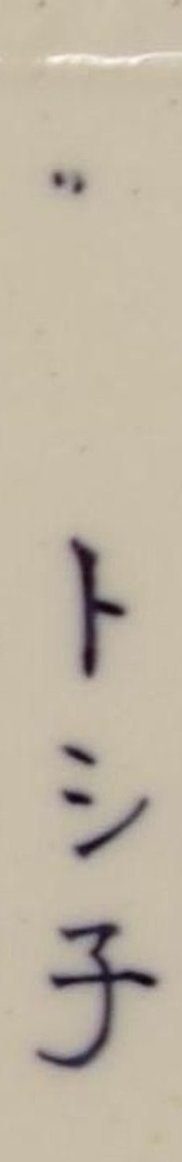トシ子
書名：E~L
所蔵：高野山金剛峯寺
